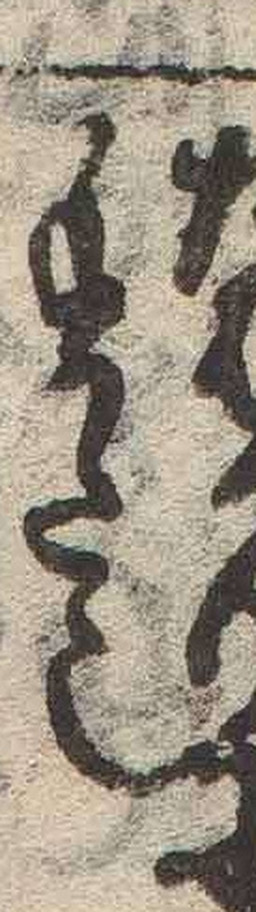手かた也
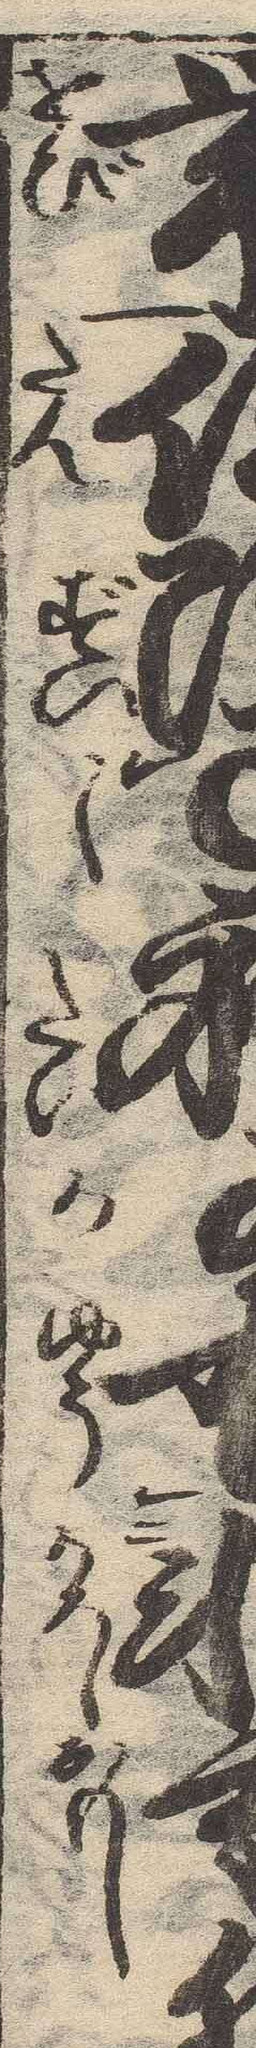をびたんずいしたいかゆうかろしおもし
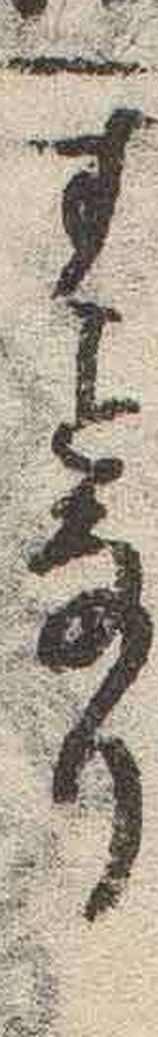すことなり
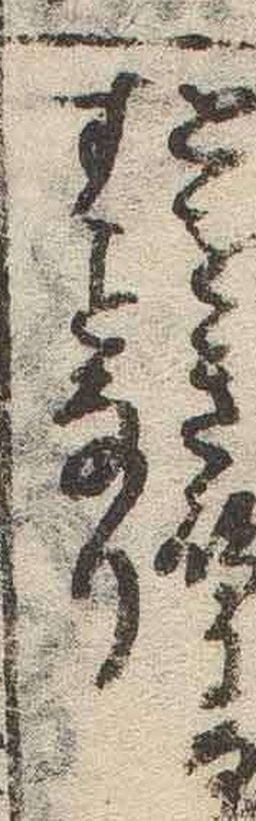すことなり
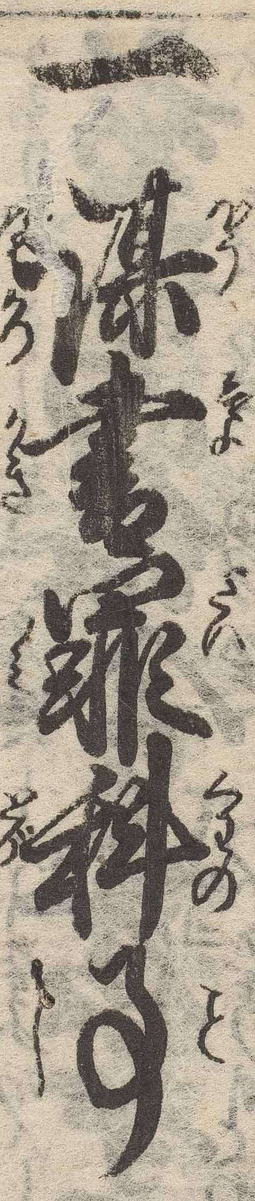一謀書罪科事
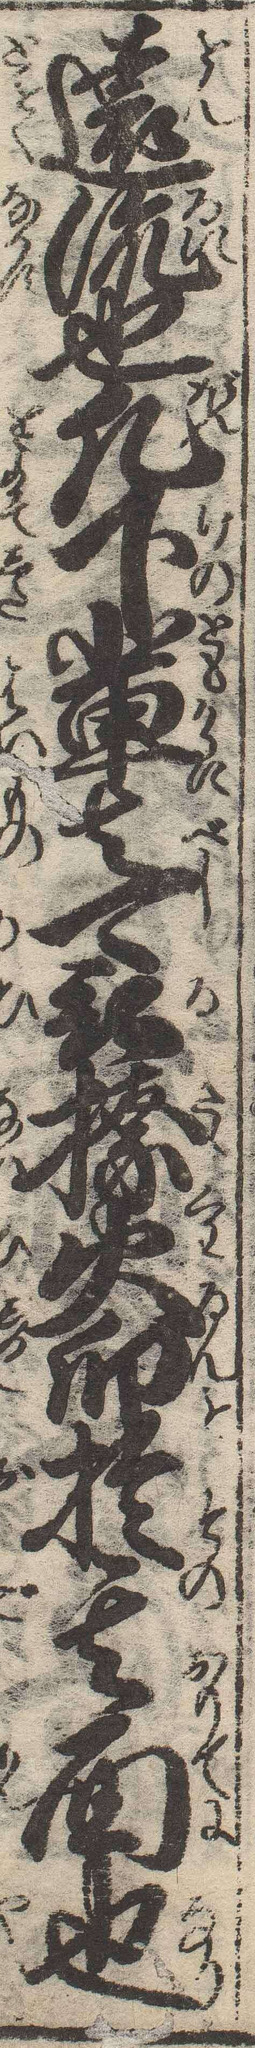遠流也凡下輩者可被捺火印於其面也
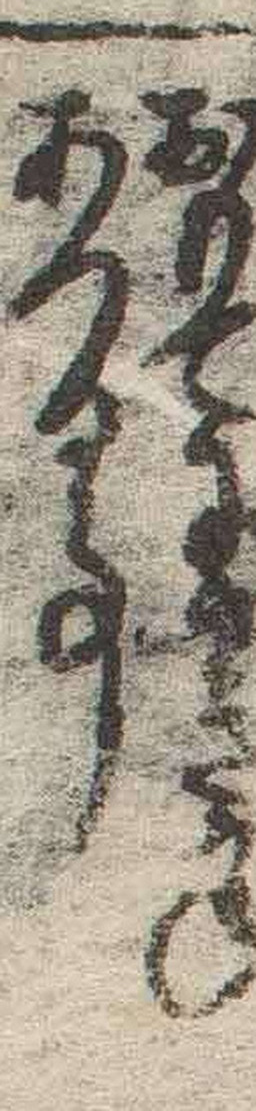あつる事
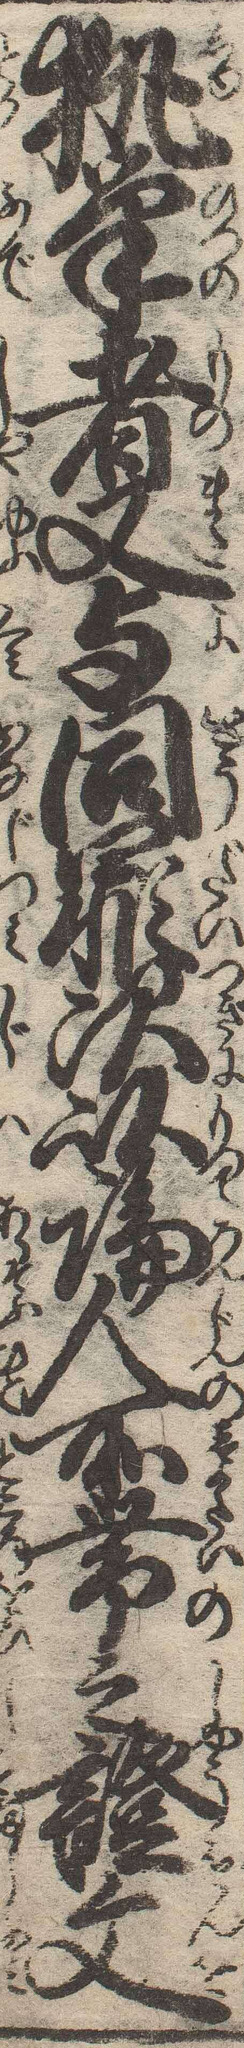執筆者又与同罪次以論人所帯之證文
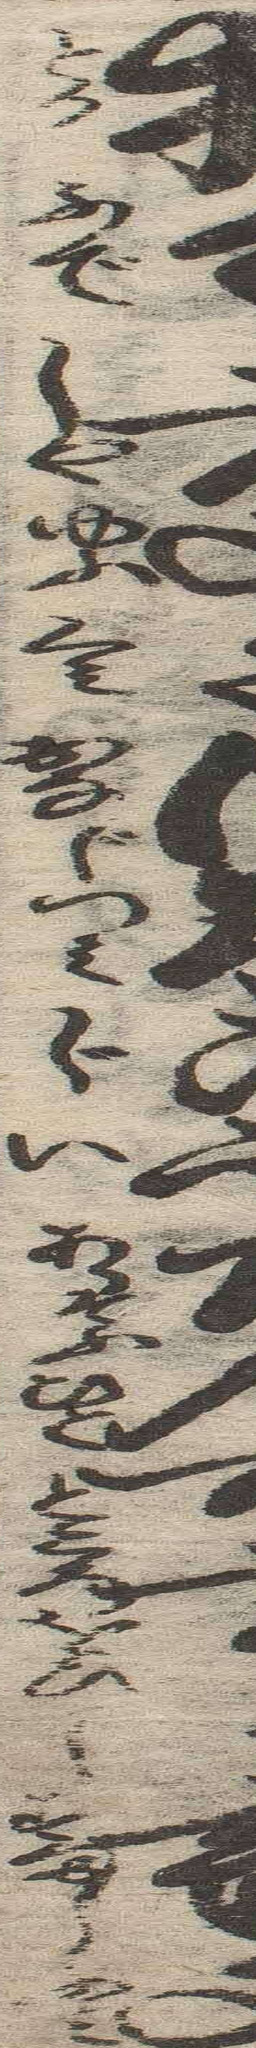とりふでしやゆふくみおなじつみじいあらそふひとところをひしすましふみ
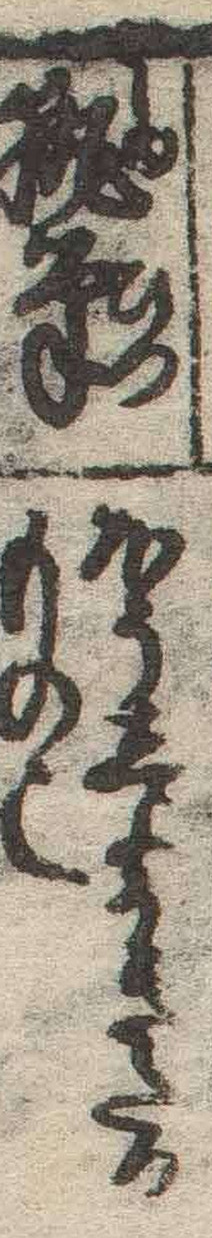執筆ほうしよかきたる
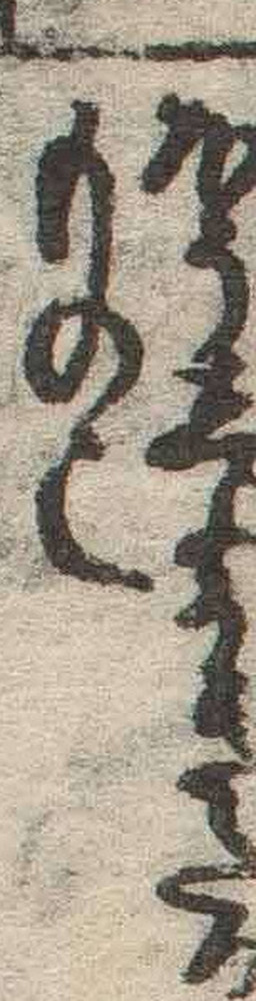もの也
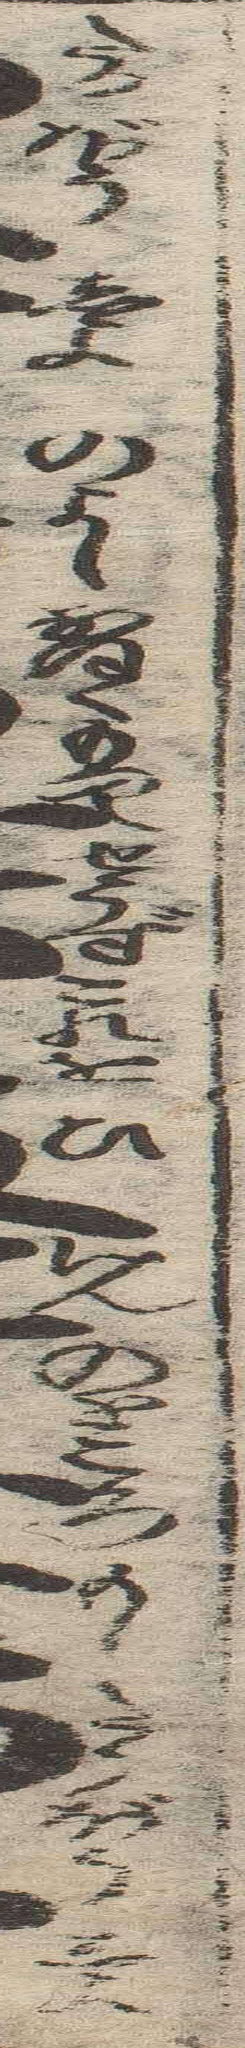たるぼうしよのよしおほくもつてせうずこれをひけんのところもしたりぼうしよ
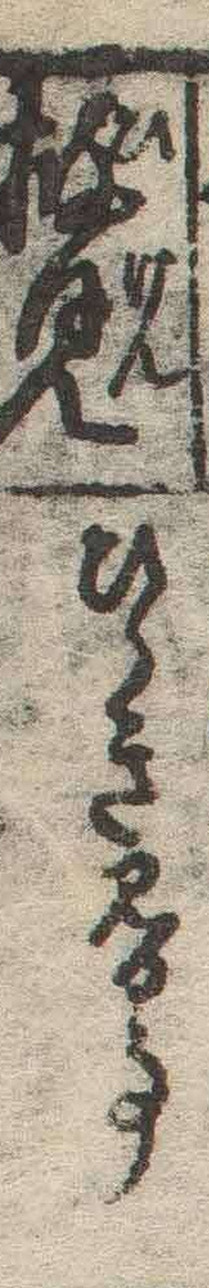披見ひらき見る事
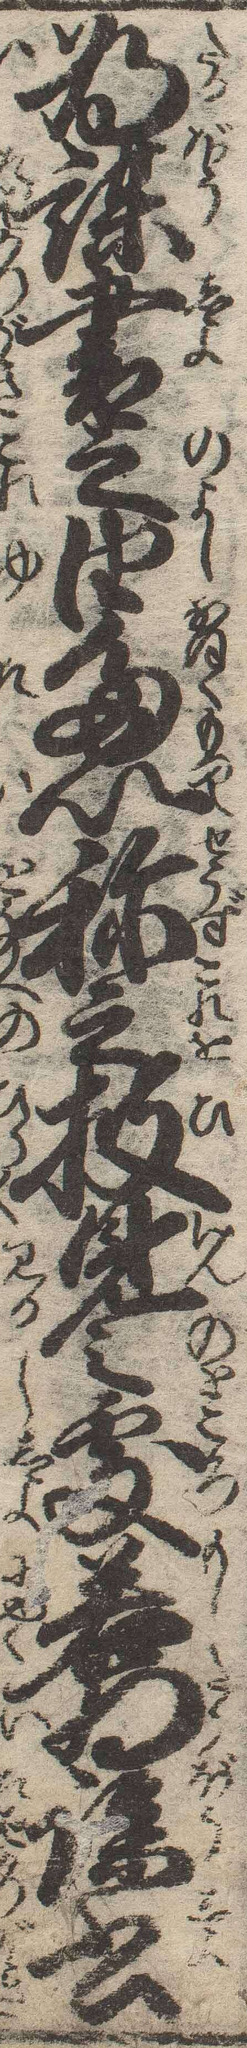為謀書之由多以称之披見之處若為謀書
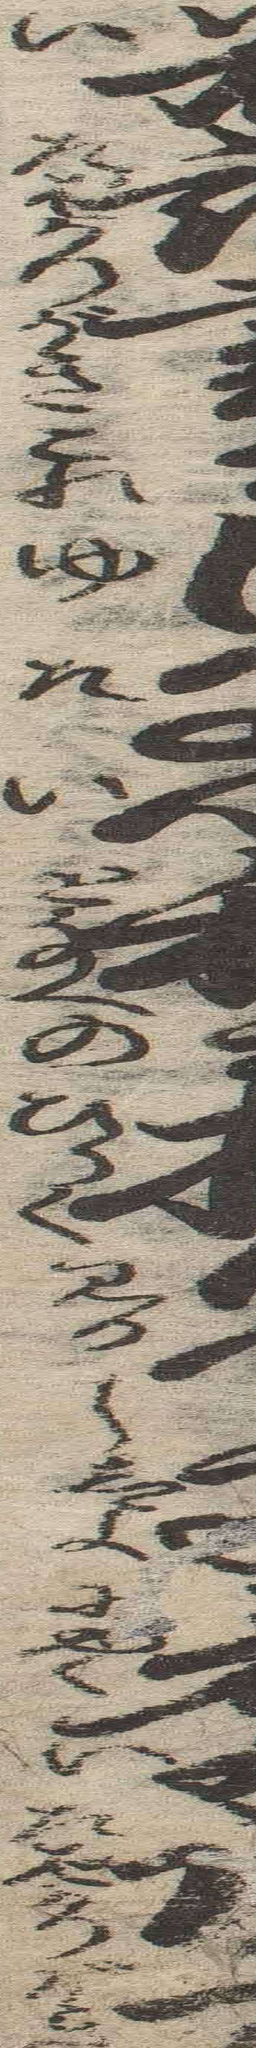いたはかりがきこれゆたいとなへのひらくみるししよにやくいたばかりがき
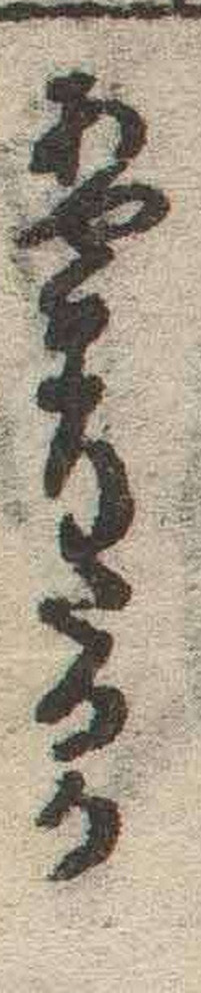繆あやまりたるか
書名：御成敗式目絵抄
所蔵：東京学芸大学附属図書館 国文学研究資料館
